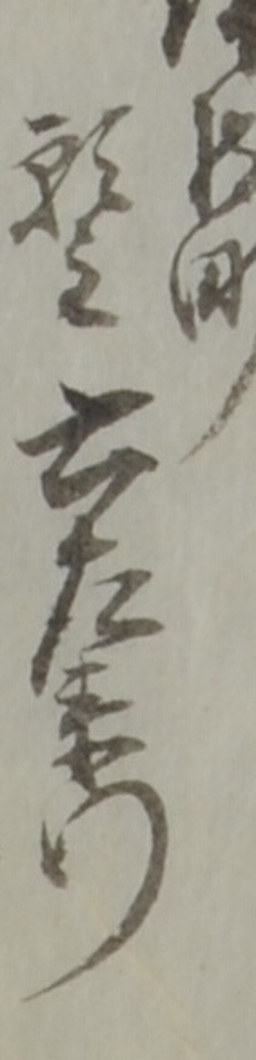願主六左衛門
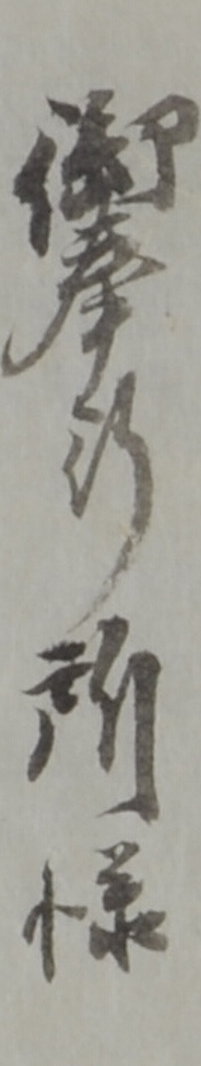御奉行所様
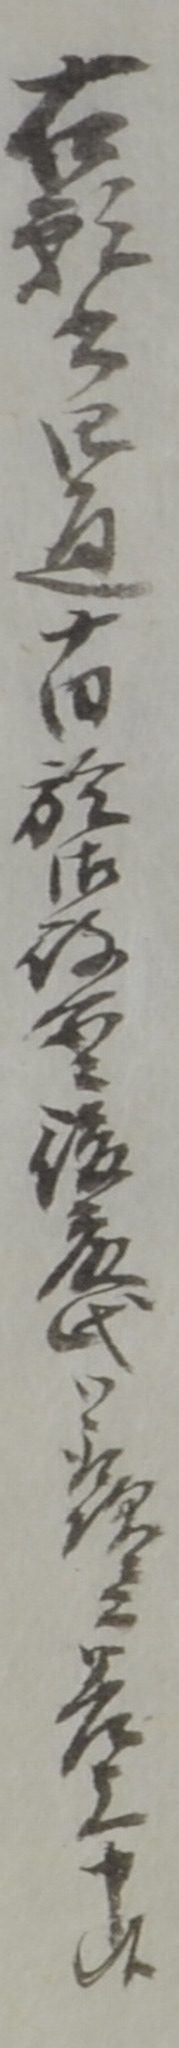右願書四通十日於御役所ニ後藤氏御取次ニ而差上申候

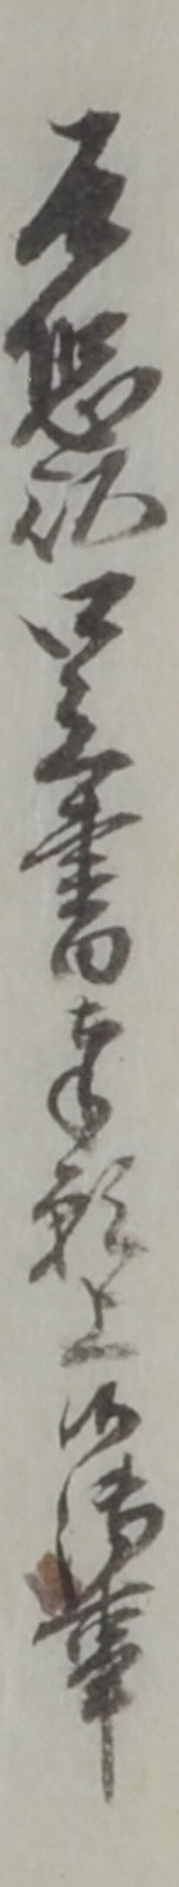乍恐以口上書奉願上候御事
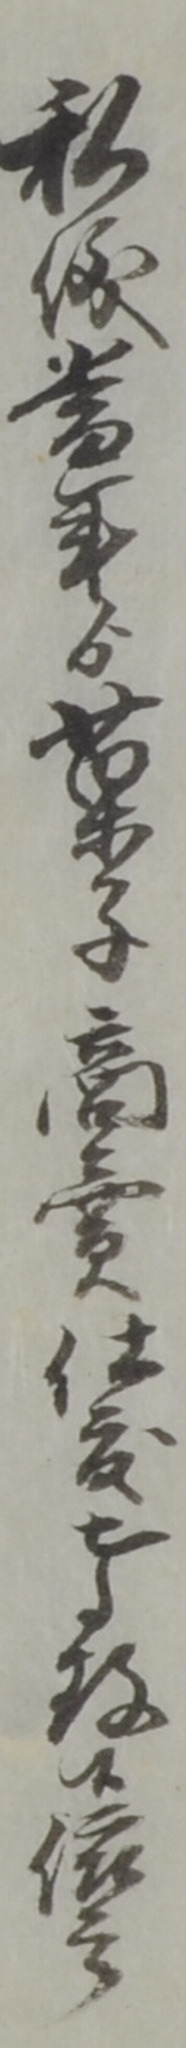私儀当年ゟ菓子商売仕度奉存候依之
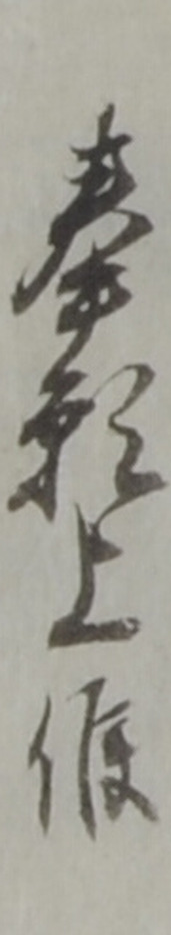奉願上候
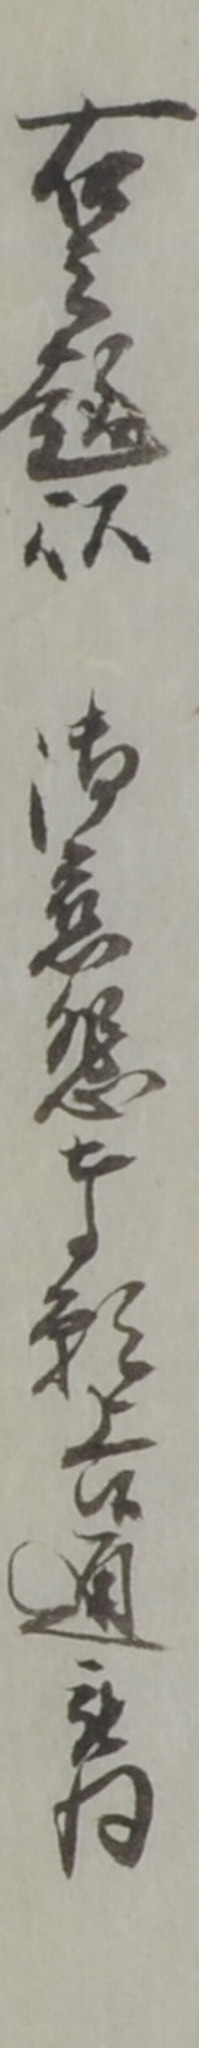右之趣以御慈悲奉願上候通被為仰付
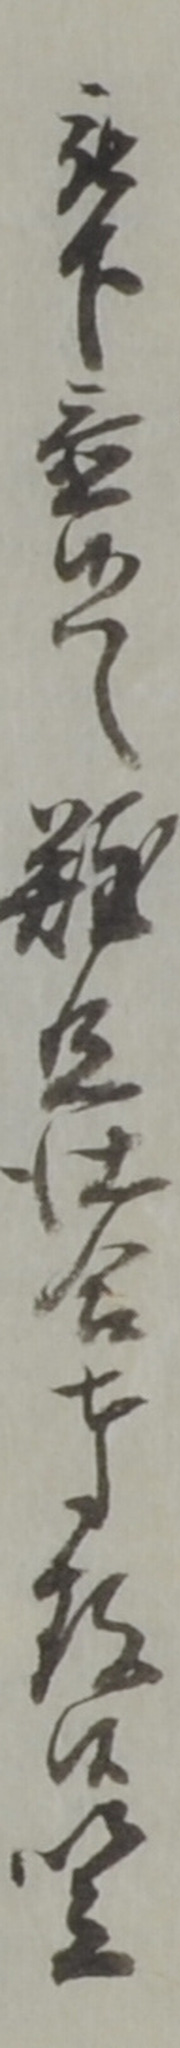被下置候ハヽ難有仕合奉存候以上
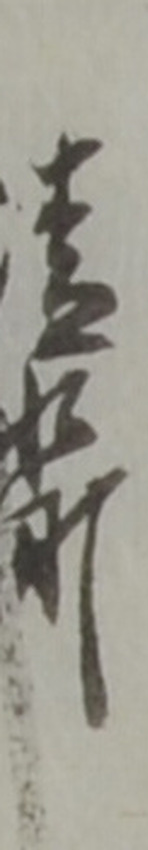清水町
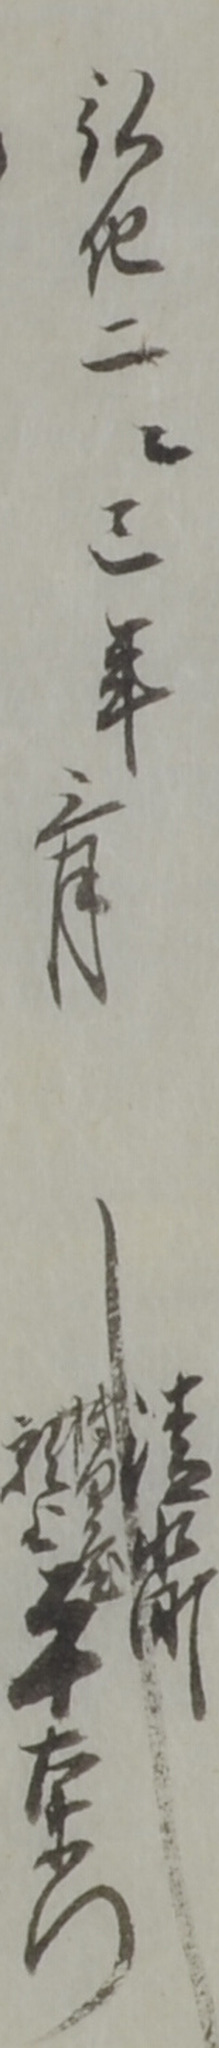弘化二乙巳年三月
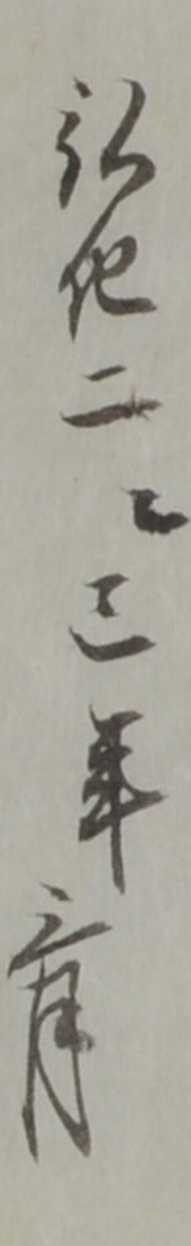弘化二乙巳年三月
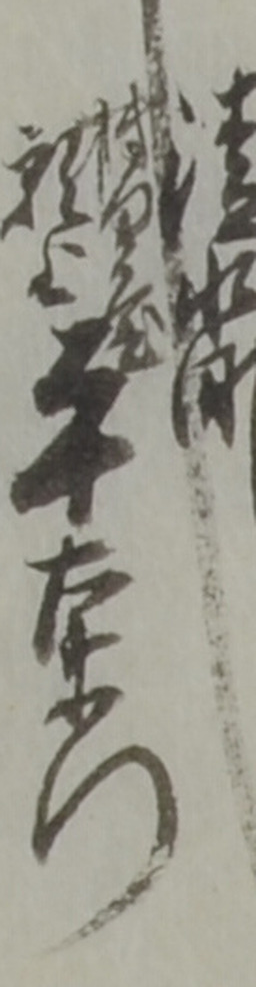願主平右衛門
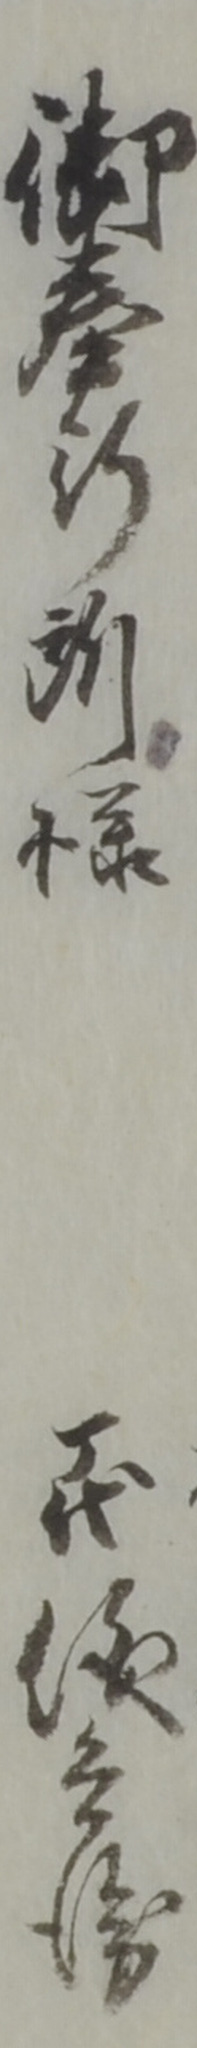御奉行所様丁代儀兵衛
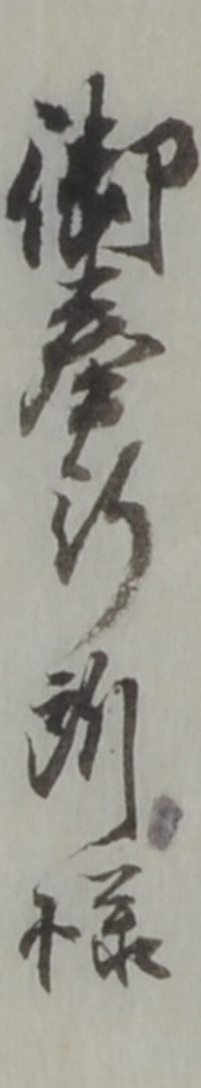御奉行所様
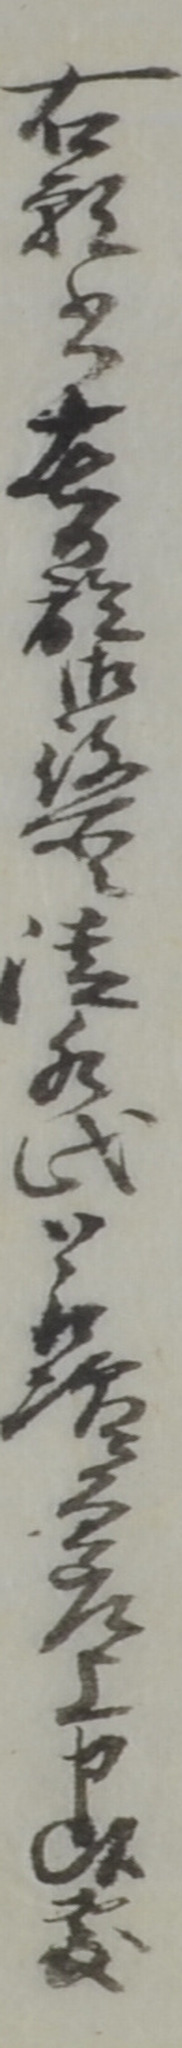右願書十七日於御役所ニ清水氏御取次ニ而差上申候義処
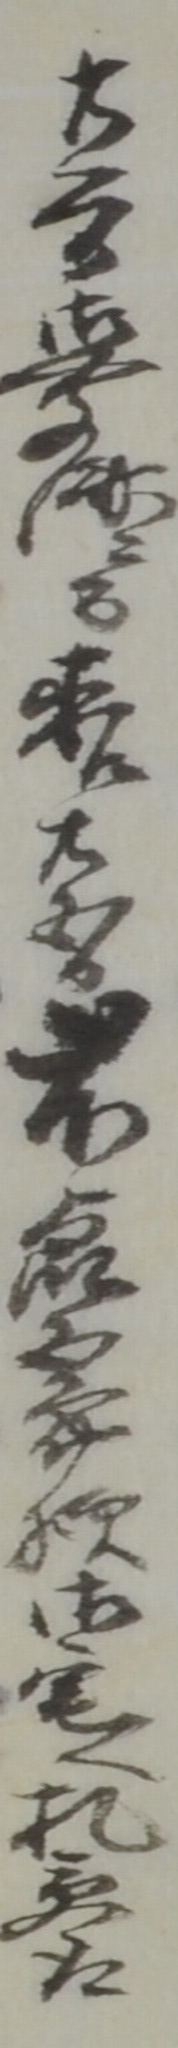廿二日御聞済ニ而来ル廿五日山下衆五郎様御宅へ札受取
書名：諸願書控簿
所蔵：伊那市立高遠町図書館・合同会社AMANE
